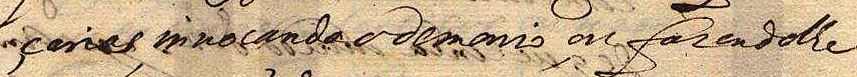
çarias, inuocando o demonio, ou fazendolhe
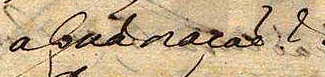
alguā oraçaõ?
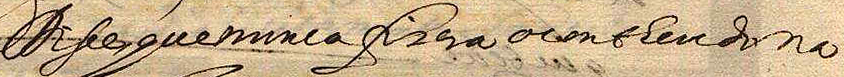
Disse que nunca fizera o contheudo na
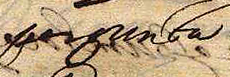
pergunta
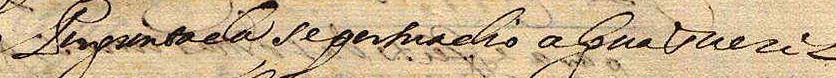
Perguntada se persuadio alguās uezes
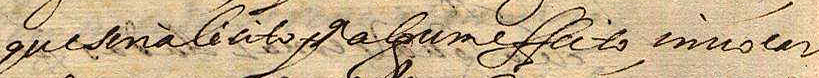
que seria licito pa algum effeito, inuocar
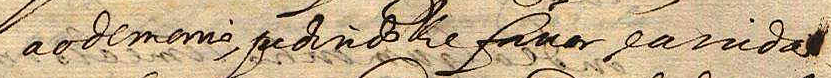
ao demonio, pedindolhe fauor e aiuda
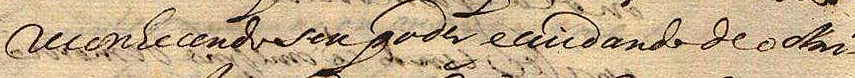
reconhecendo seu poder e cuidando de o obri
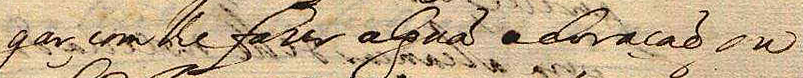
gar, com lhe fazer alguā adoração ou
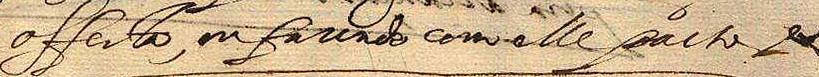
offerta, ou fazendo com elle pacto &
